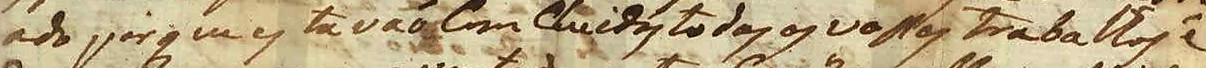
ado porque estavaõ ComCluidas todos os vossos trabalhos ē
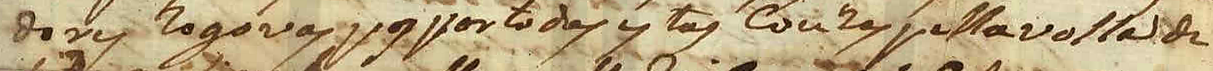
dores Rogovos pos por todas estas Couzas pella vossa de
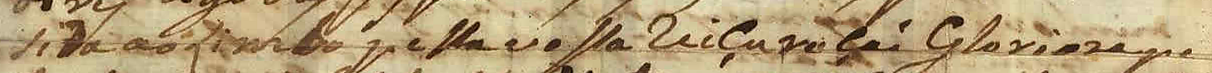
sida ao Limbo pella vossa ReiÇureiÇaõ Glorioza pe
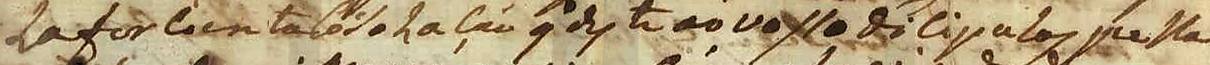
La forCoenta CoSoLaÇaõ q̄ deste ao vosso dicipulos pella
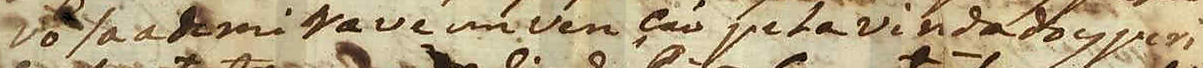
vosa ademirave emvençaõ pela vinda do esperi
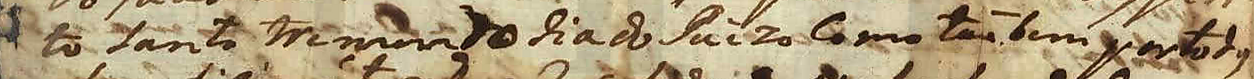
to santo tremendo dia do Iuizo Como taõbem por todos
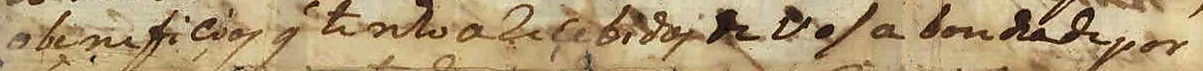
o benefiçios q̄ tenho a Reçebidos de vosa bondade por
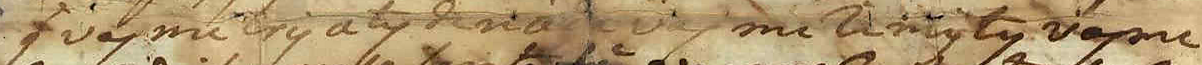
q̄ vos me Eris a tas dezialhe vos me Rimastas vos me
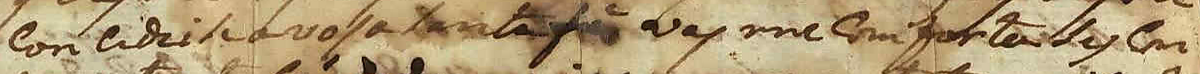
Concideis e a santa fé vos me Comfortenses Con
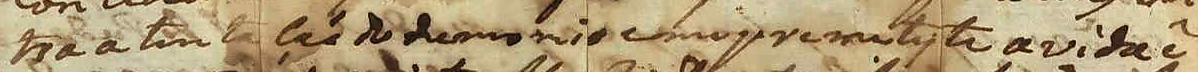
tra a tentaçaõ do demonio e me premeteste a vida ē
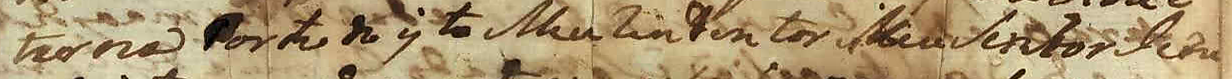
teroza por tudo isto Meu Ridentor Meu Senhor Iezu
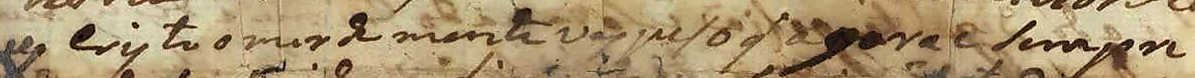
us Cristo omerdemente vos peso q̄ agora e sempre
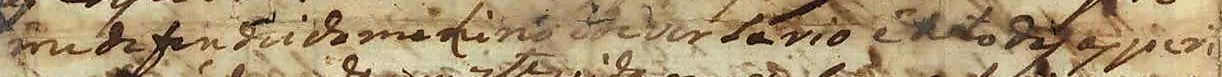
me defendei do maLino adeversario e de todos os peri
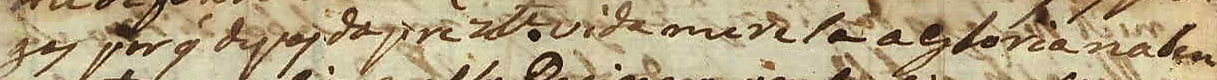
gos por q̄ depos da prezete vida meresa a Gloria na ben
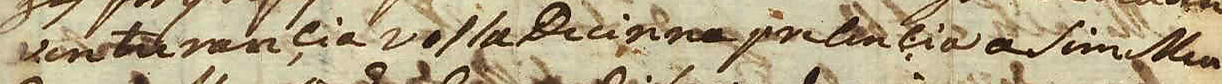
venturançia vossa Decinna precençia aSim Meu
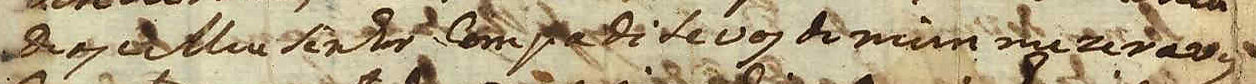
Deos e Meu sinhor Compadisevos de mim mezeraves
